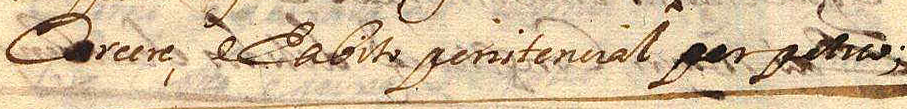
Carcere, e habito penitencial perpetuo;
